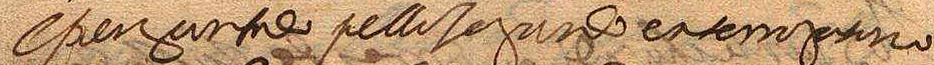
E perguntado pello segundo enterrogatorio
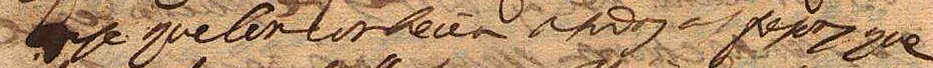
dise que ben conhecia a todas as pesoas que
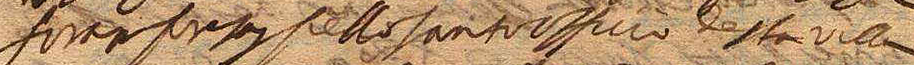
foran presas pello santo officio desta villa
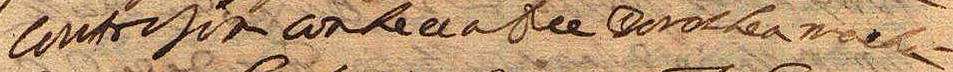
E outrosim conhece a Ree Dorothea macha
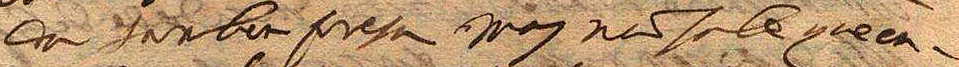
da tanben presa mas naõ sabe que em
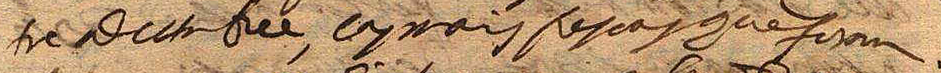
tre a ditta Ree, e as mais pesoas que foram
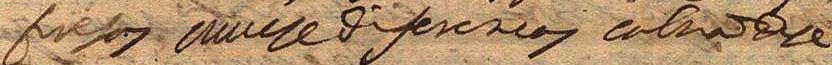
presas ouuese diferencas e al naõ dise
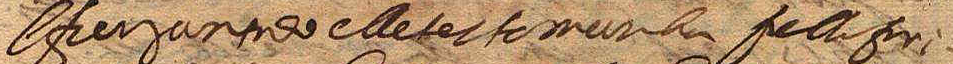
E perguntado elle testemunha pello pri
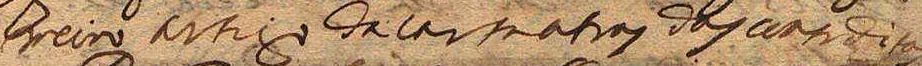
meiro artigo da carta atras das contraditas
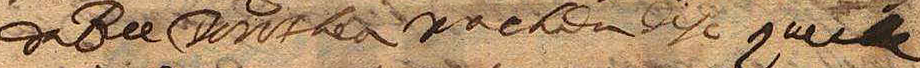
da Ree Dorothea machada dise que elle
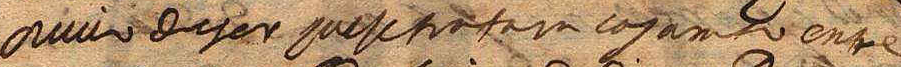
ouuio diser que se tratara cazamento entre
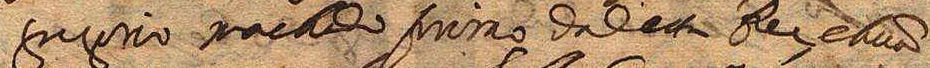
gregorio machado primo da ditta Ree, e huā
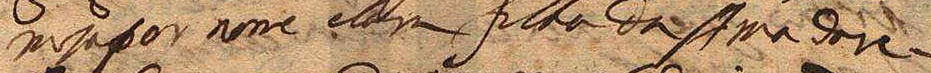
mosa por nome clara, filha da Ama da re
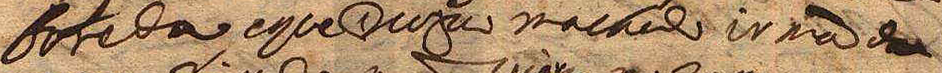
boreda, e que Dioguo machado irmão do
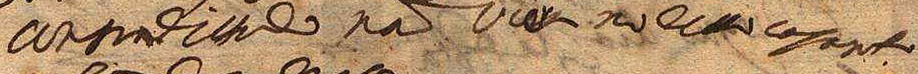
contradittado não viera no ditto casamt.o
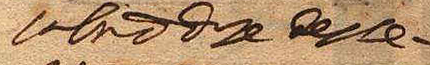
e al não disse deste –
